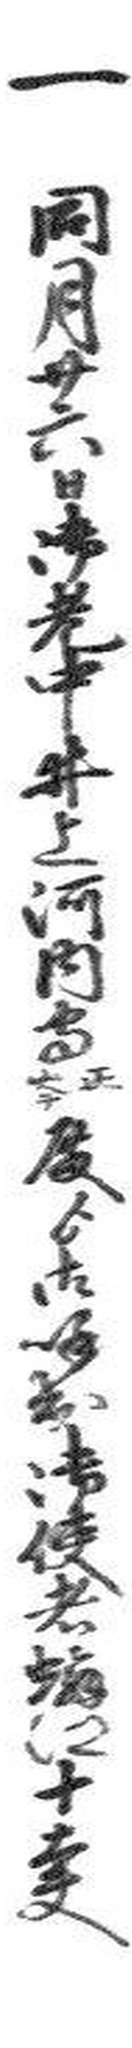一同月廿六日御老中井上河内守正峯殿ゟ御呼出御使者蠏江十大夫
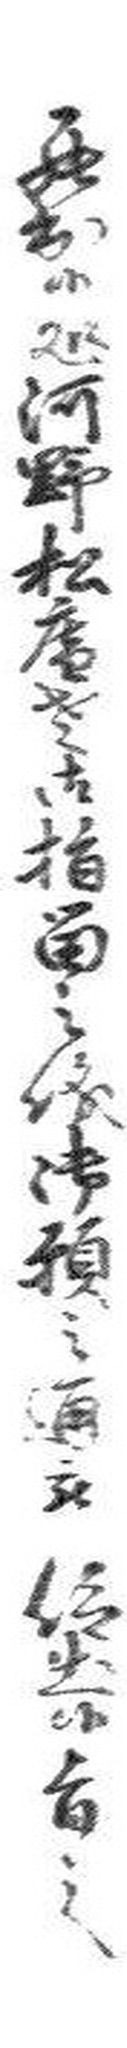罷出候処河野松庵老御指留之儀御願之通被仰出候旨之江
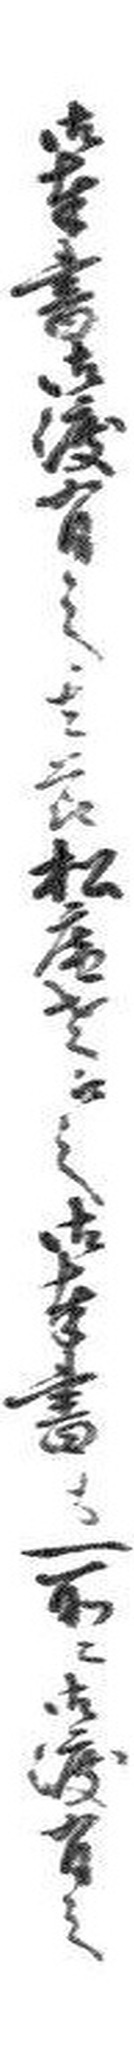御奉書御渡有之其節松庵老江之御奉書も一所ニ御渡有之
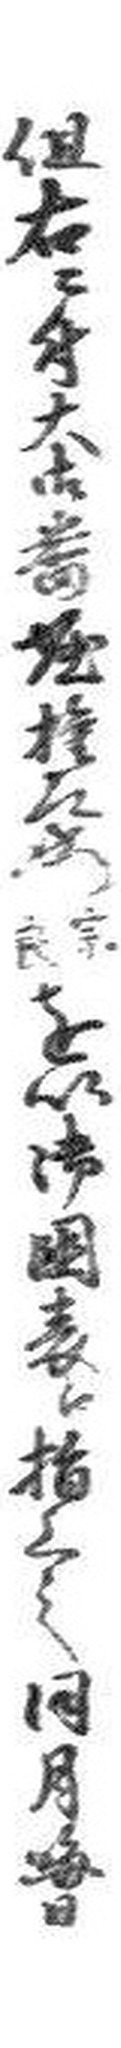但右ニ付大御番堀権左衛門宗良を以御国表江指上之同月晦日
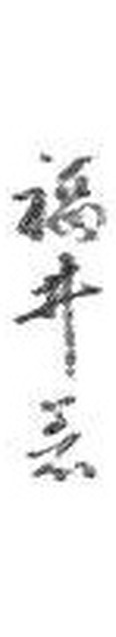福井着
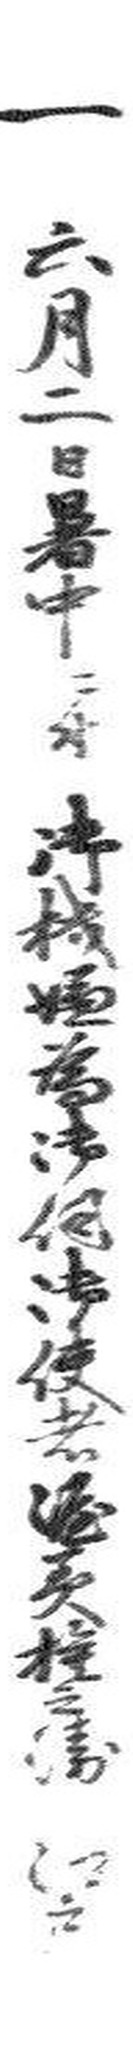一六月二日暑中ニ付御機嫌為御伺御使者渥美権兵衛
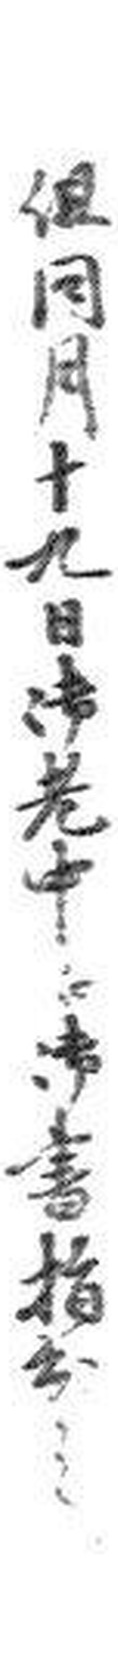但同月十九日御老中江御書指出之

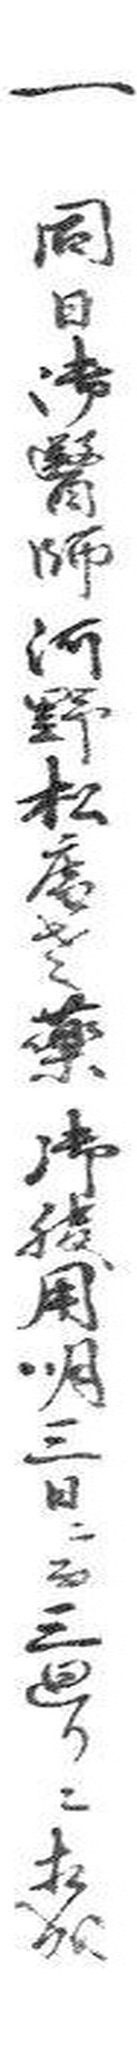一同日御医師河野松庵老薬御服用明三日ニ而三廻リニ相成
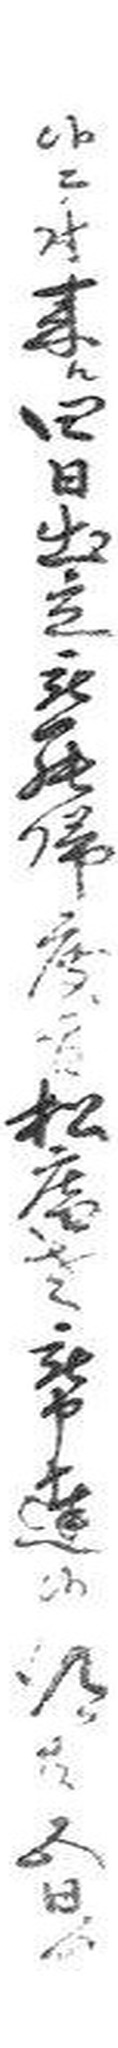候ニ付来ル四日出立被罷帰度旨松庵老被申達候得共五日ゟ
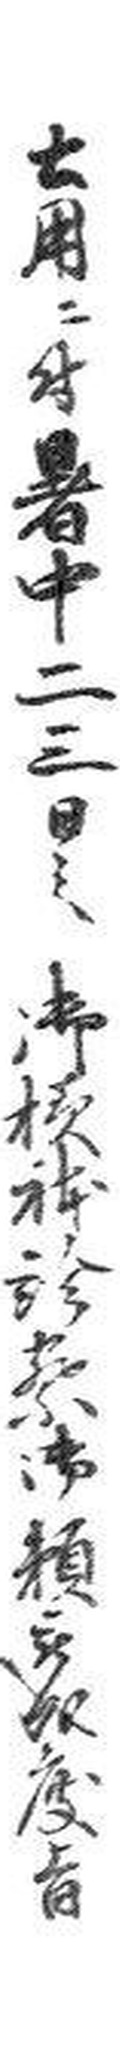土用ニ付暑中二三日之御様体診察御願被成度旨
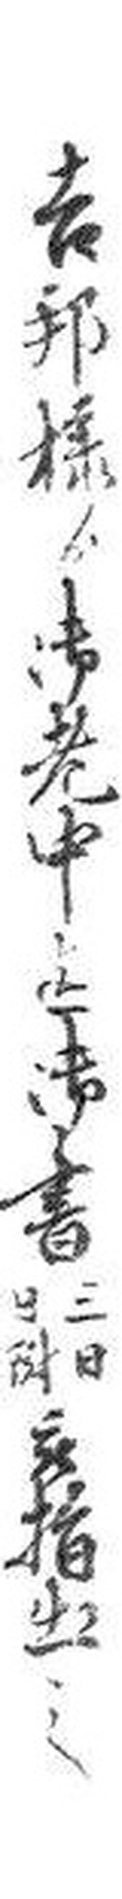吉邦様ゟ御老中迄御書三日日附被指出之
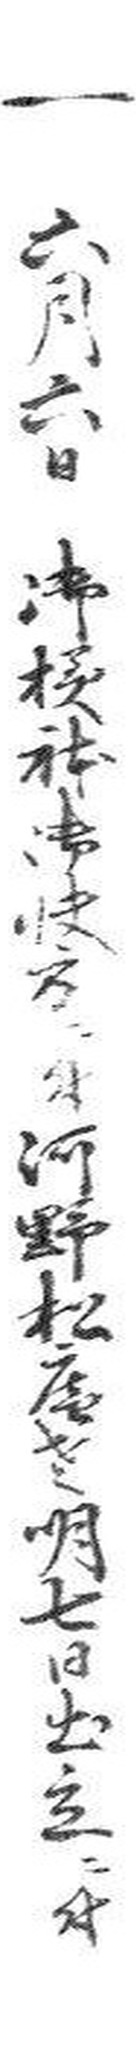一六月六日御様体御快方ニ付河野松庵老明七日出立ニ付
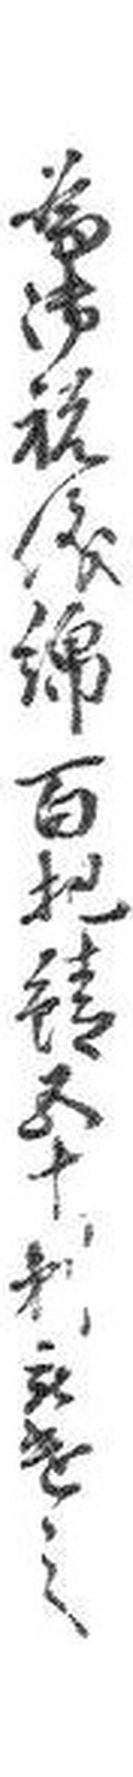為御祝儀綿百把鯖五十刺被遣之
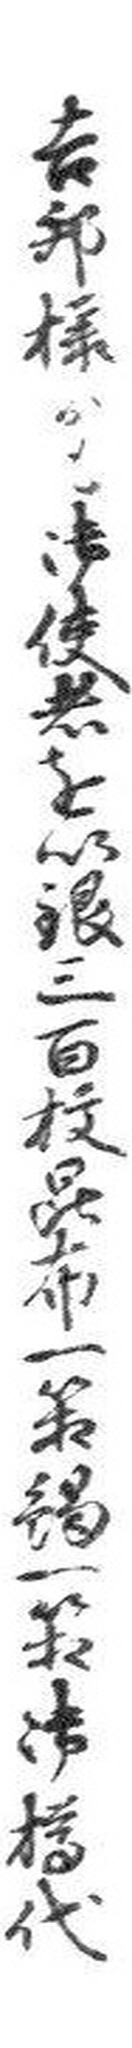吉邦様ゟ御使者を以銀三百枚昆布一箱鯣一箱御樽代
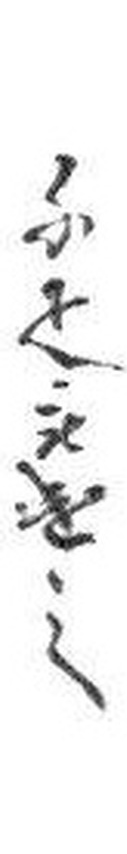千疋被遣之
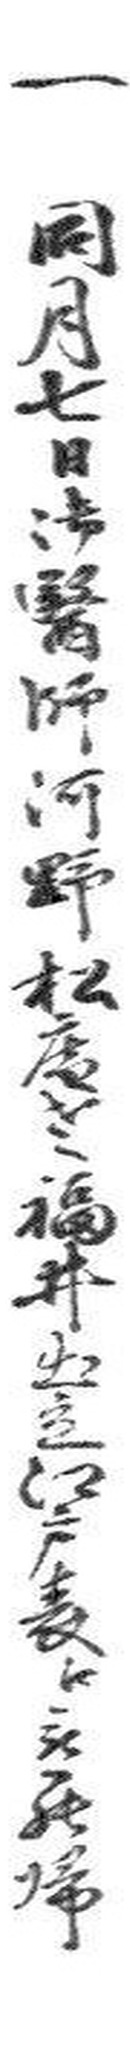一同月七日御医師河野松庵老福井出立江戸表江被罷帰
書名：家譜 二十六 吉品公 従宝永七年到正徳二年
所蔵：福井県文書館 Fukui Prefectural Archives
